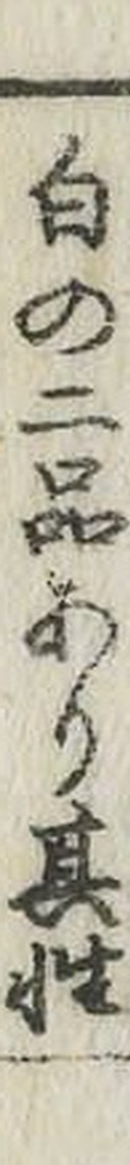白の二品あり其性
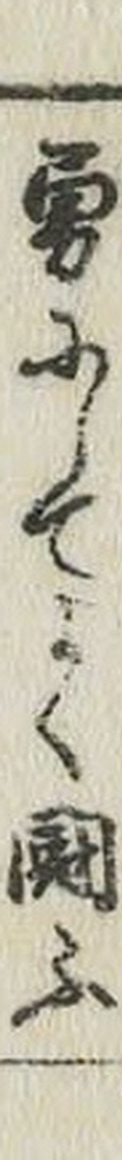勇にしてよく闘ふ
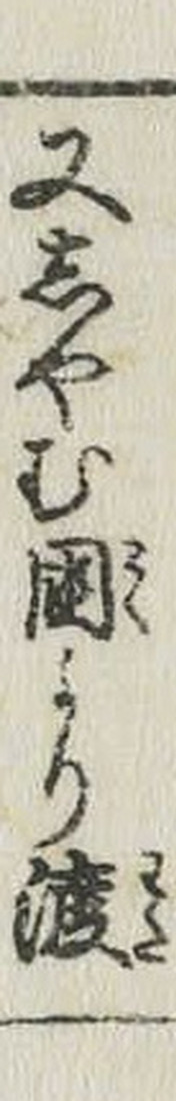又しやむ国より渡
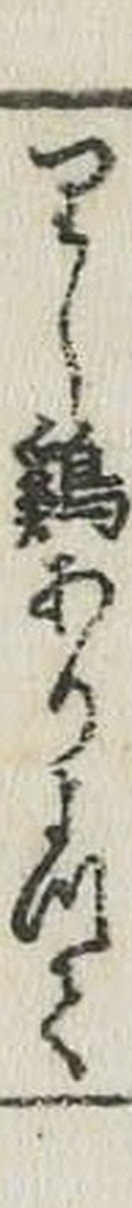りし鶏ありよつて
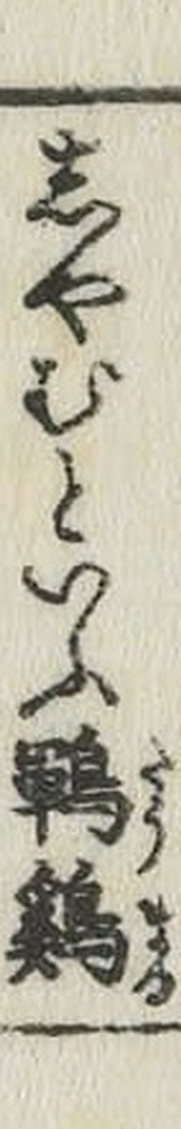しやむといふ鶤鶏
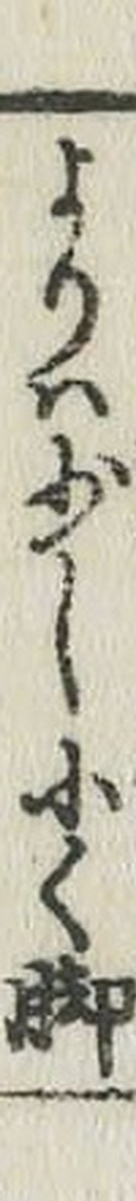よりは少し小く脚
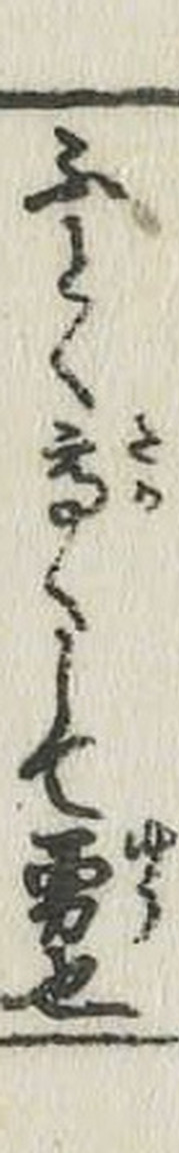ふとく高くして勇也
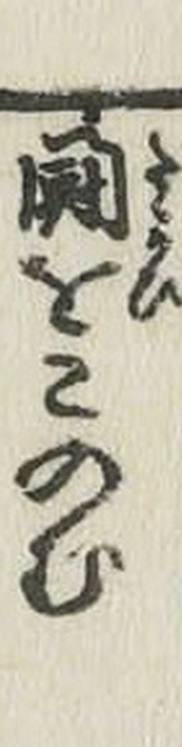闘をこのむ
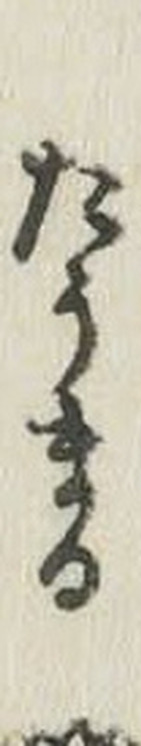たうまる
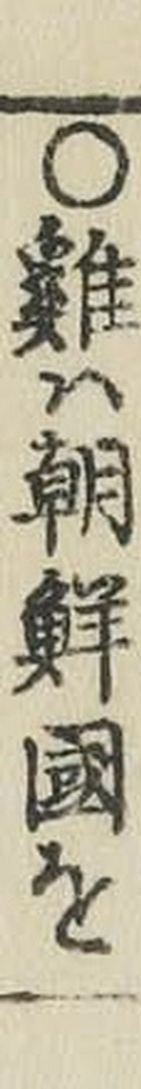○鶏は朝鮮国を
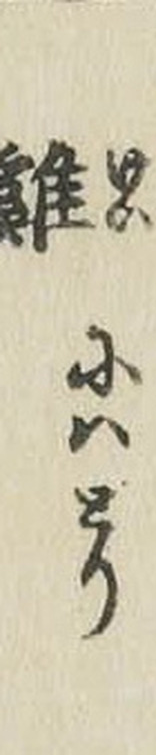鶏にはとり
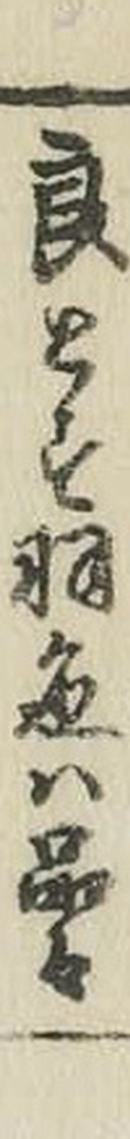良とす羽色は品々
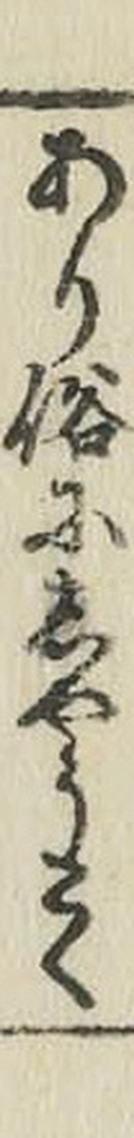あり俗にしやうこく
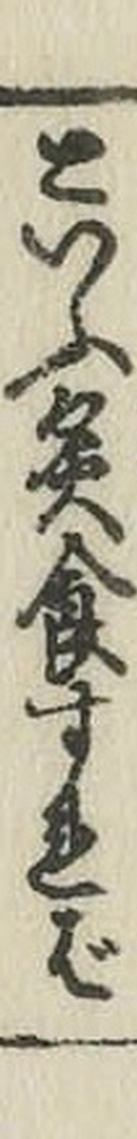といふ炙食すれば
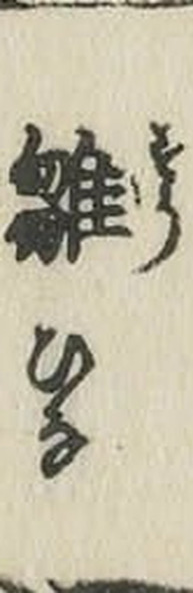雛ひな
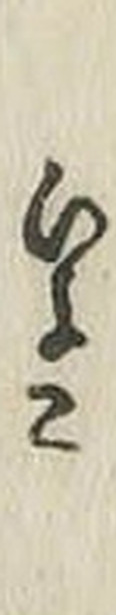ひよこ
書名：増補頭書訓蒙図彙大成 10巻 6:巻之12-13
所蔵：東京学芸大学教育コンテンツアーカイブ
